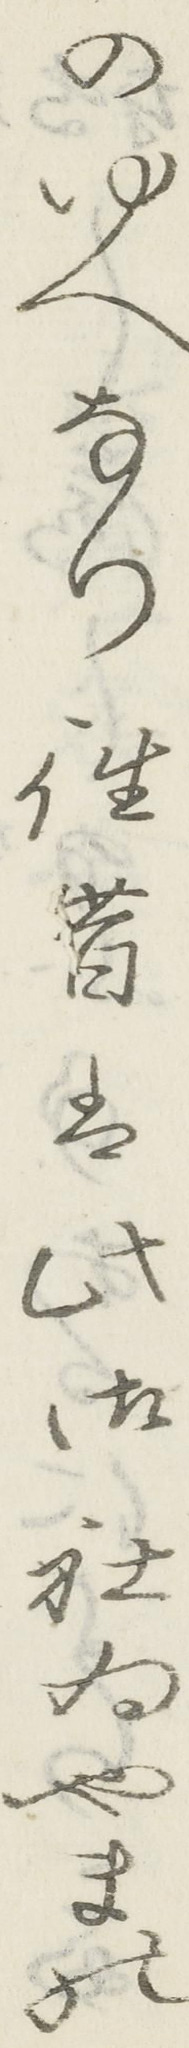のゆへなり往昔は此御社ゐやまの
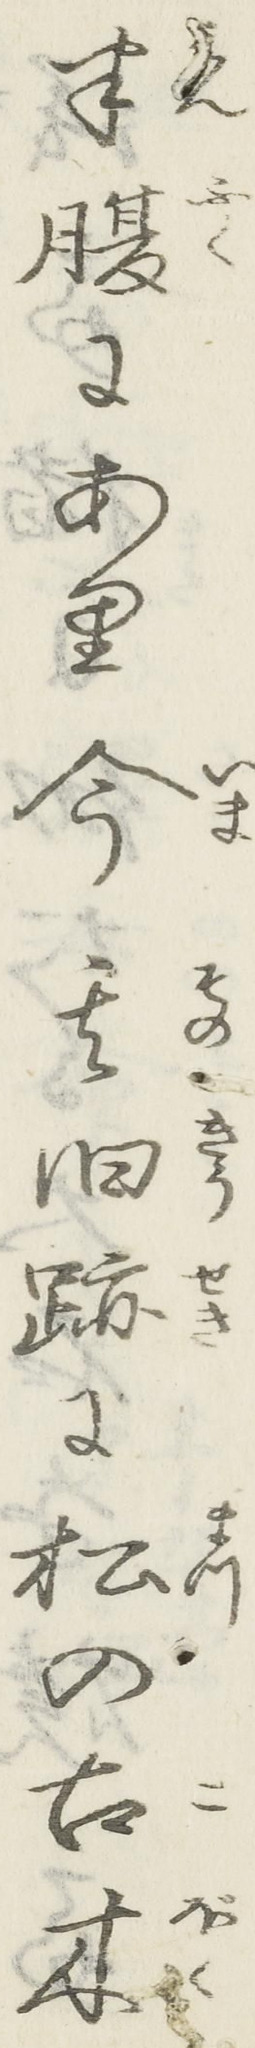半腹にあり今其旧跡に松の古木
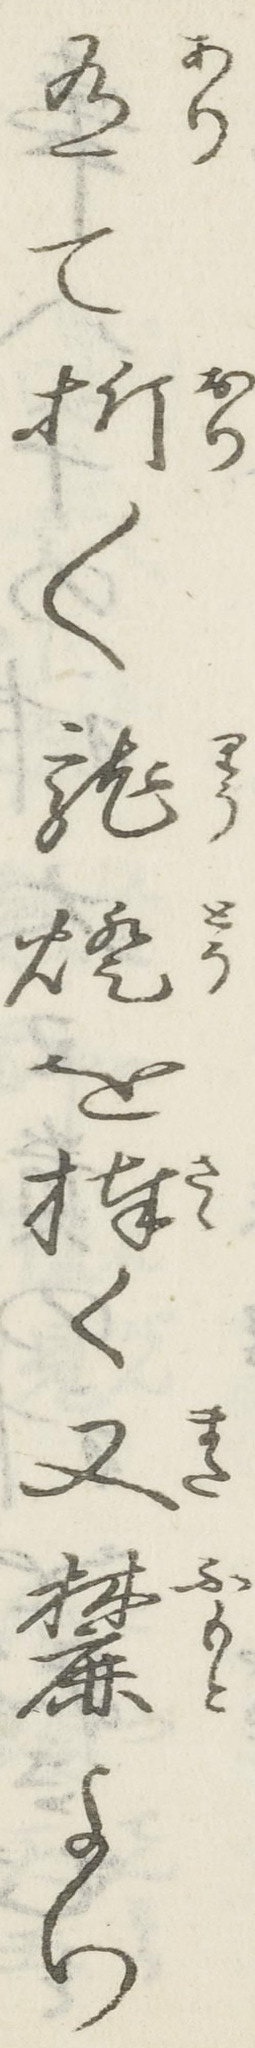有て折〱龍燈を捧く又麓より
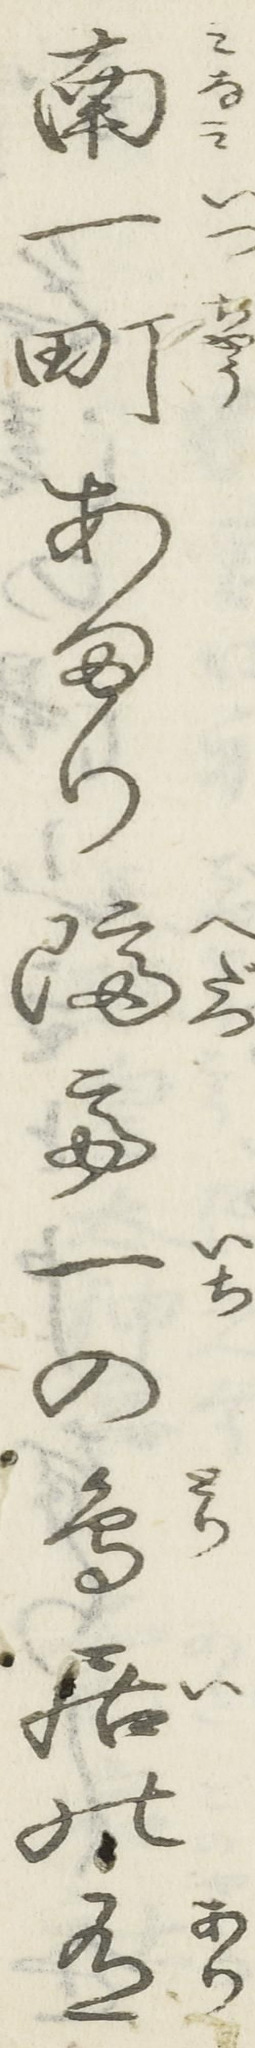南一町あまり隔て一の鳥居の有
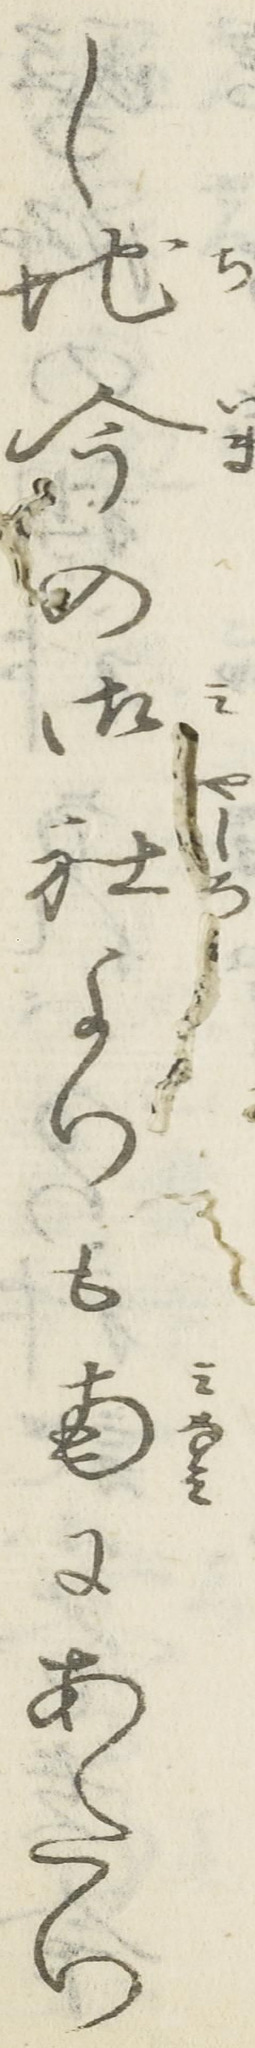し地今の御社よりも南にあたり
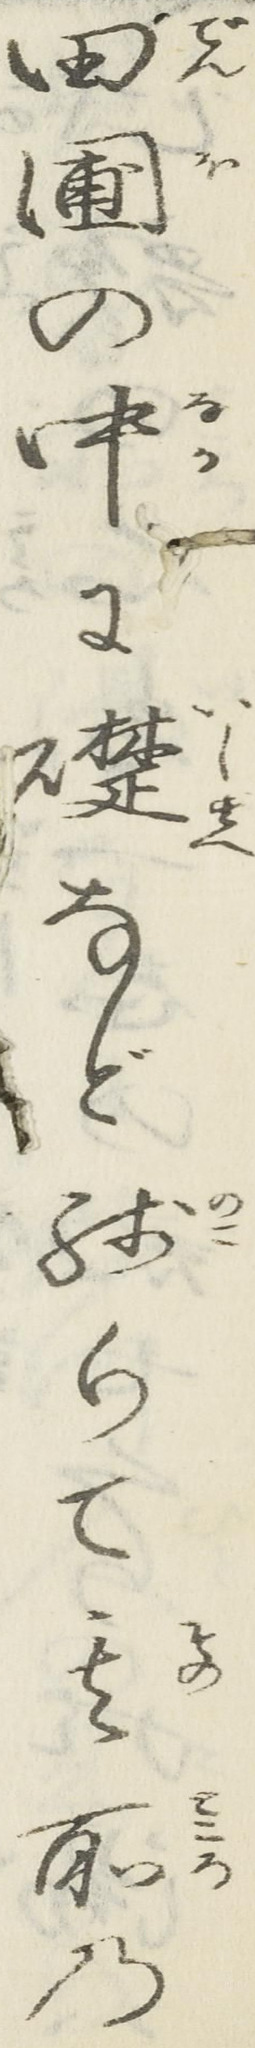田圃の中に礎など残りて其所の
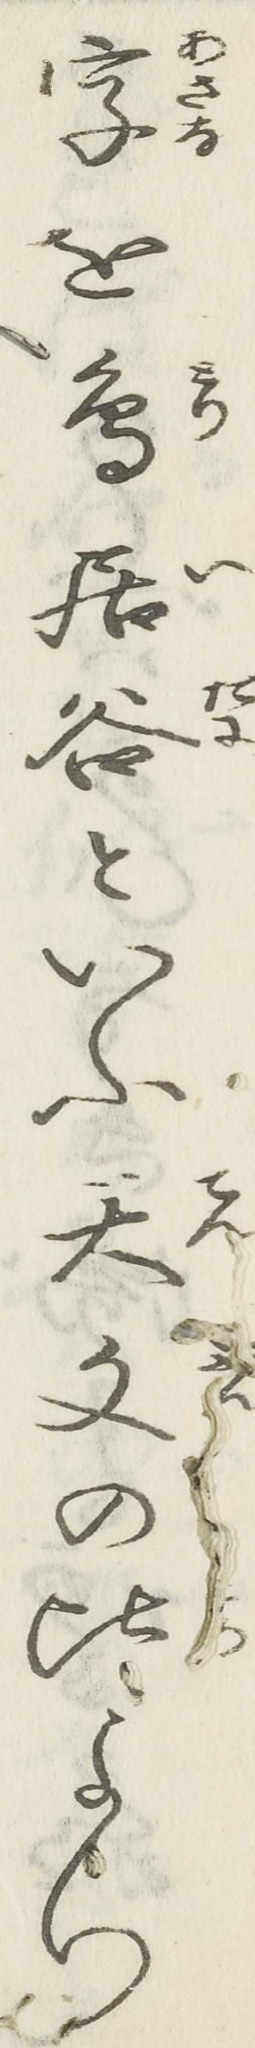字を鳥居谷といふ天文の比より
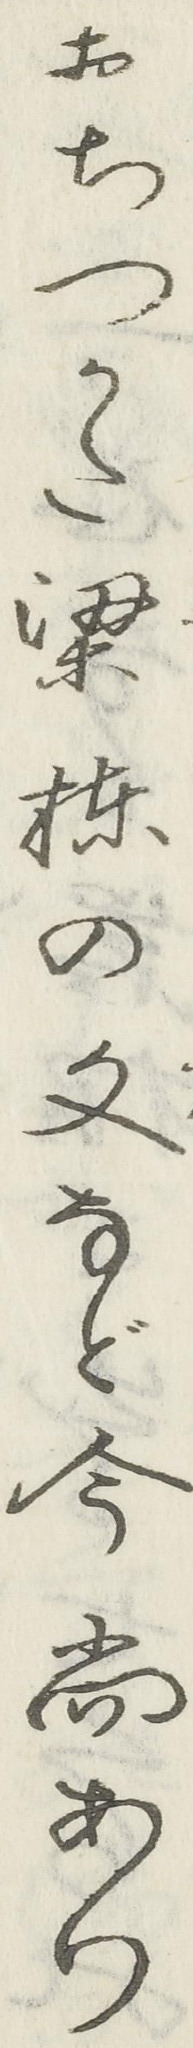おちつかた梁棟の文など今尚あり
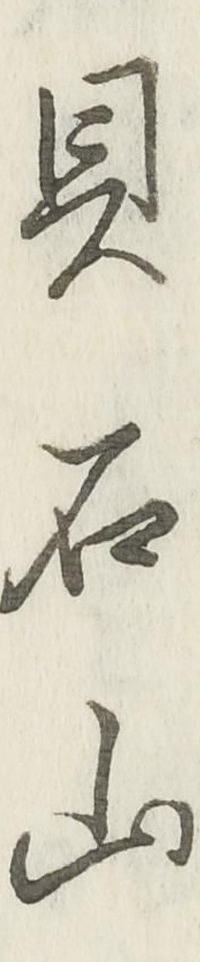貝石山
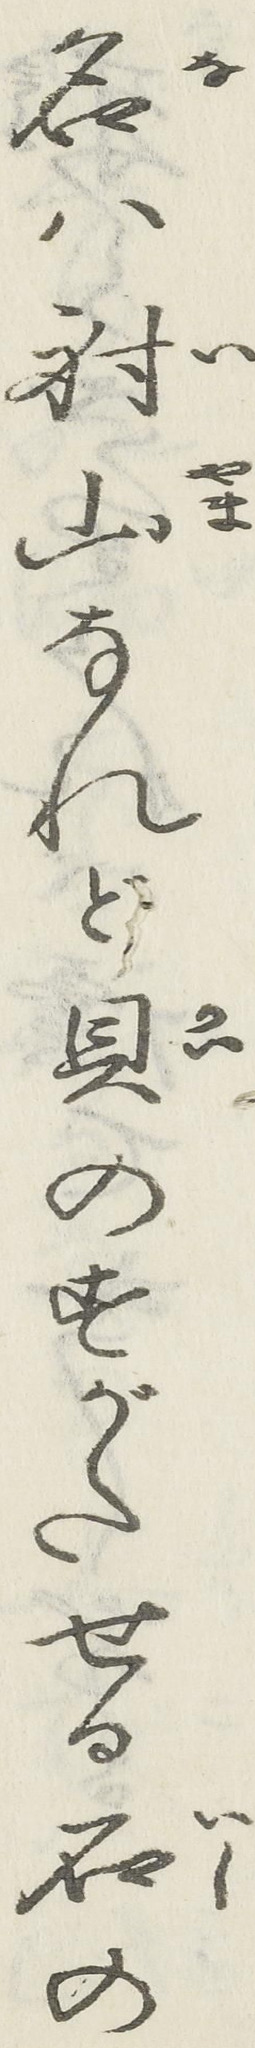名は射山なれど貝のすがたせる石の
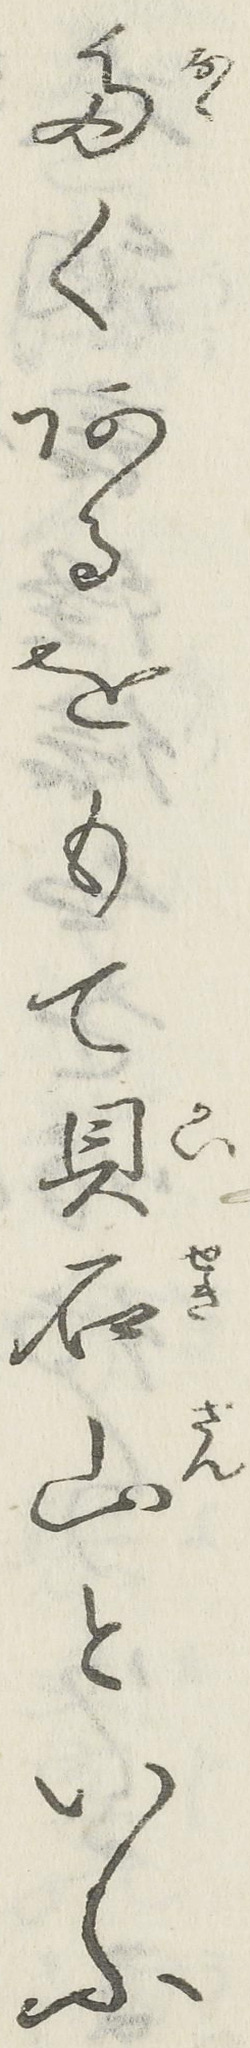多くあるをもて貝石山といふ
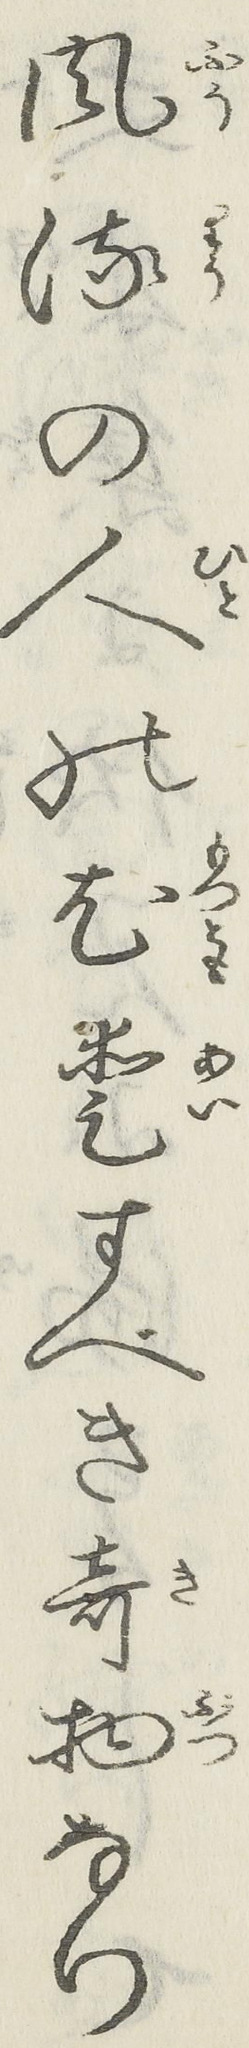風流の人の尤愛すべき奇物なり

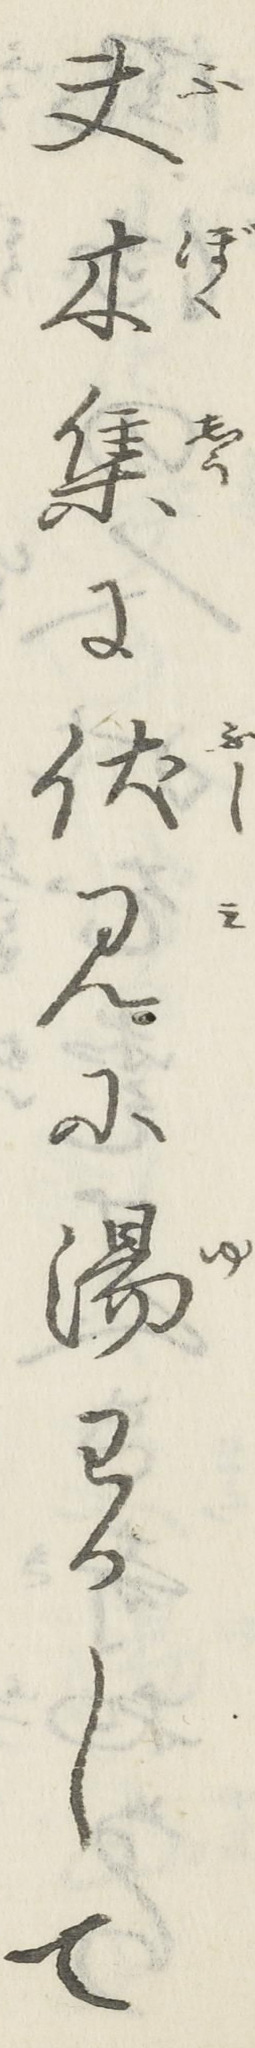夫木集に伏見に湯わかして
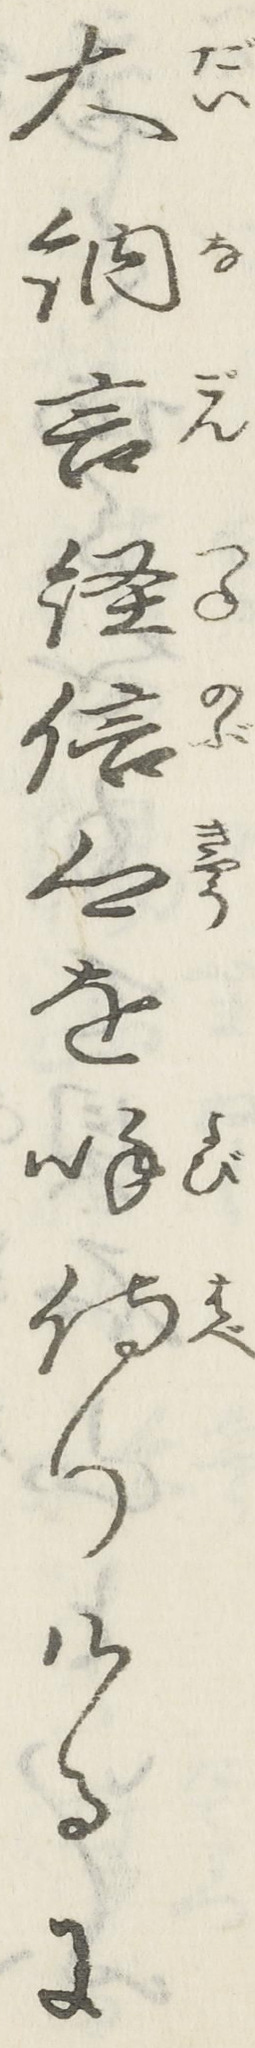大納言経信卿を呼侍りけるに
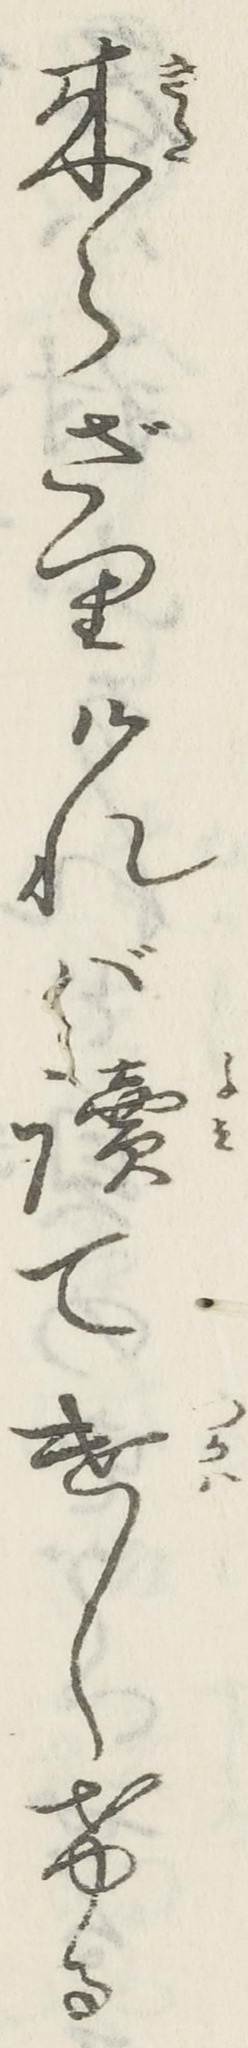来らざりければ読て遣しける
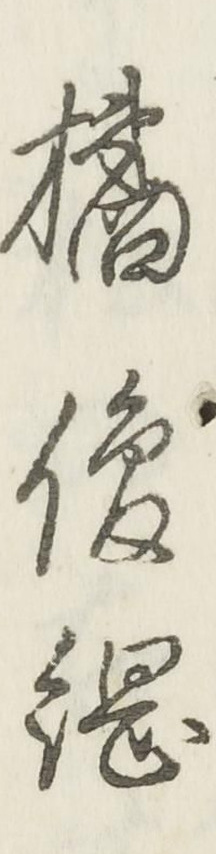橘俊綱
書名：温泉来由記
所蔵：東京大学地震研究所図書室 Earthquake Research Institute Library, The University of Tokyo, JAPAN
